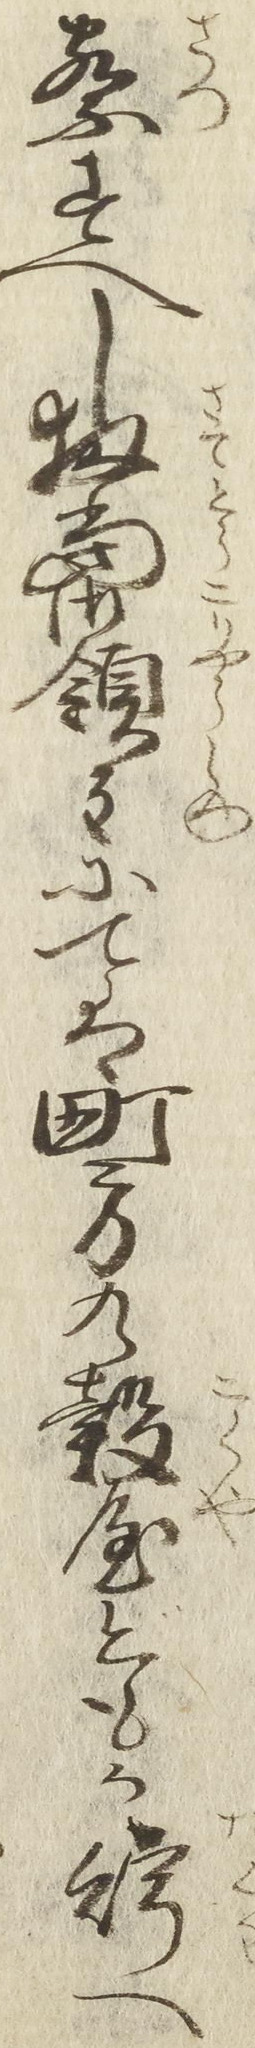察すへし扨当御領主にては町方の穀屋ともか貯へ
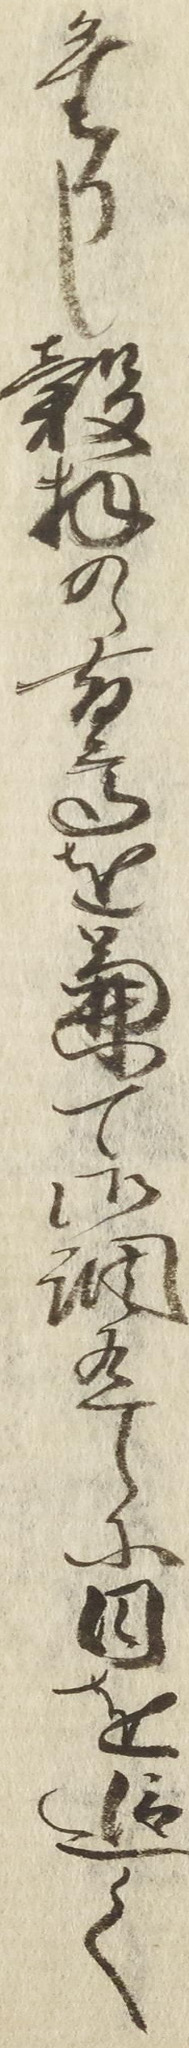たりし穀物の有高を兼て御調有しに日を追て
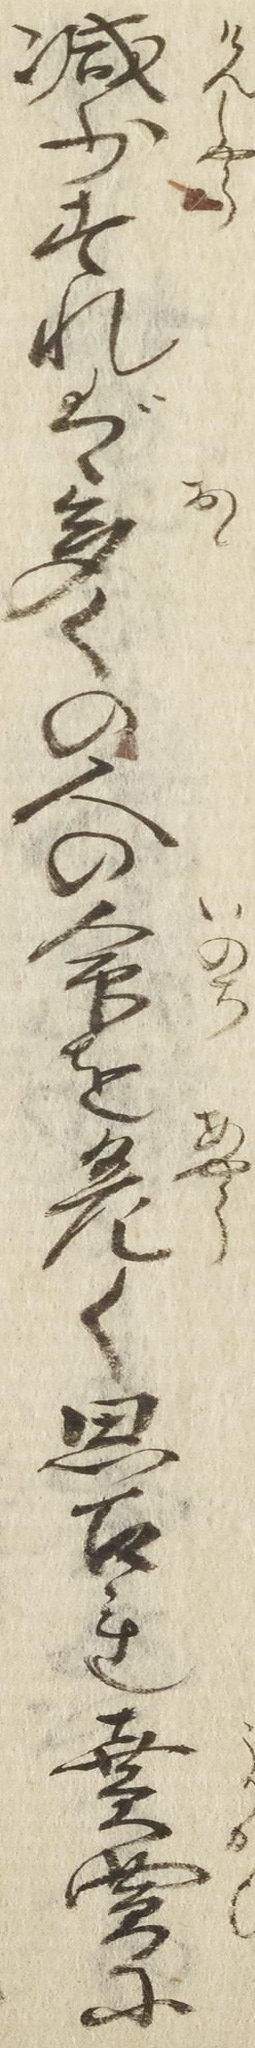減少すれば多くの人の命を危く思召れ売買に
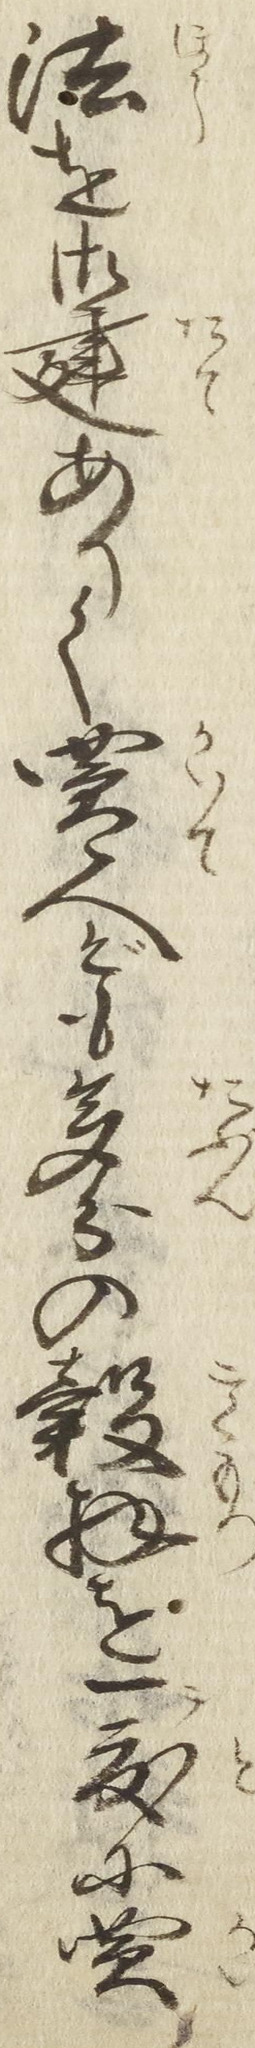法を御建ありて買人とも多分の穀物を一度に買
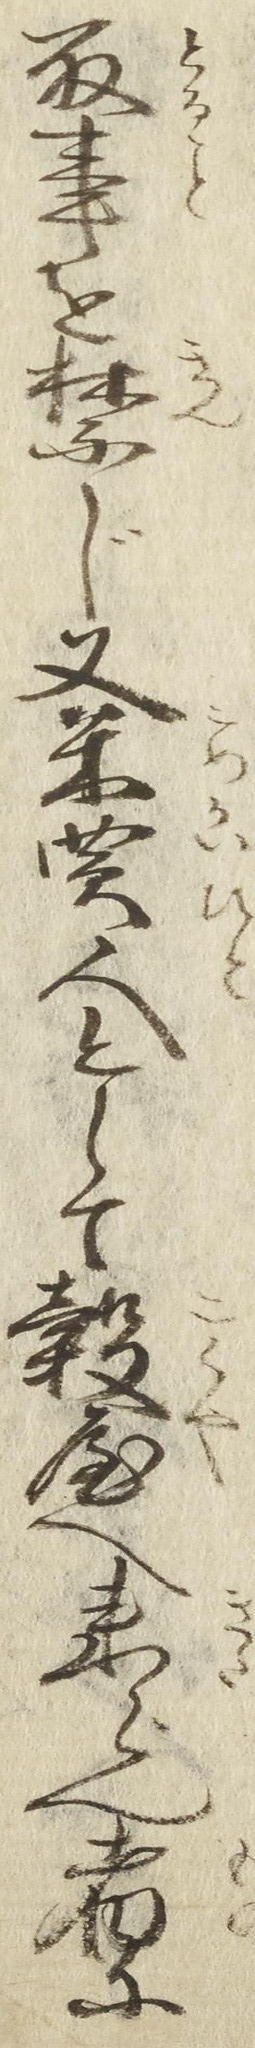取事を禁じ又米買人として穀屋へ来らん者に

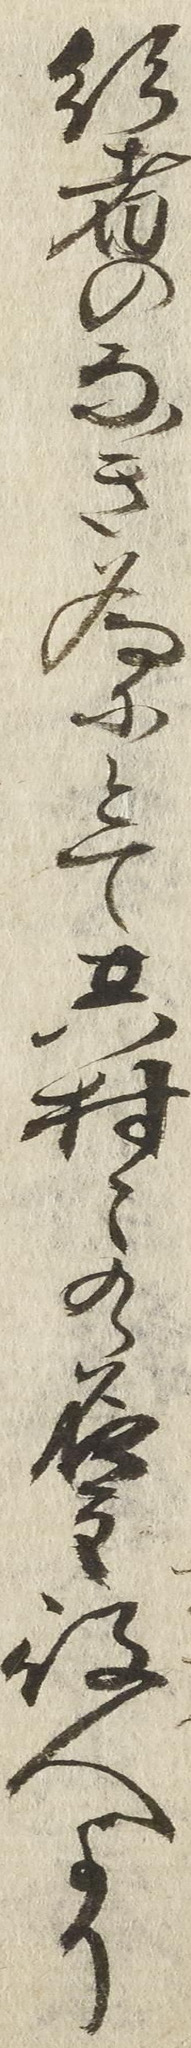紛者のなき為にとて其村〻の名主役人より
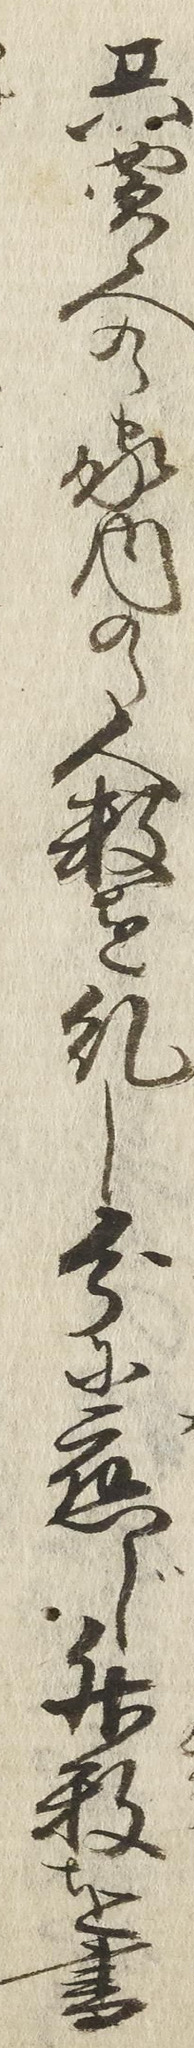其買人の家内の人数を糺し分に応じ升数を書
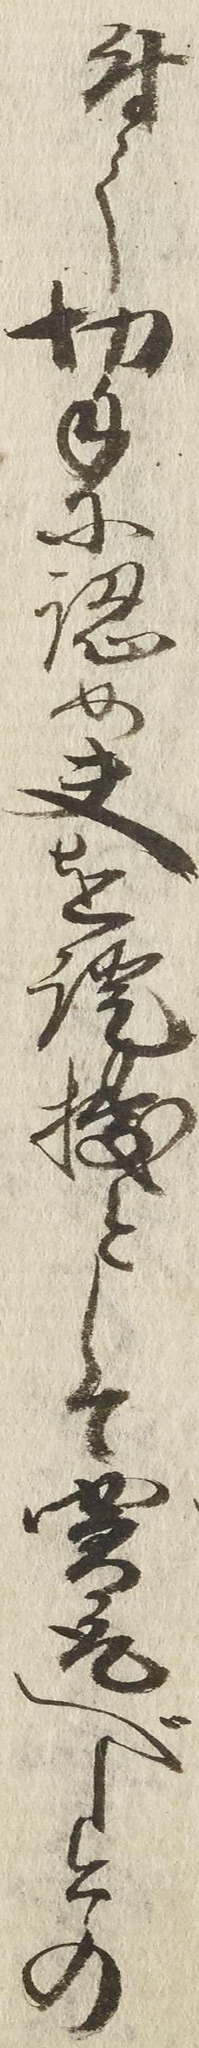付て切手に認め夫を證拠として買取べしとの
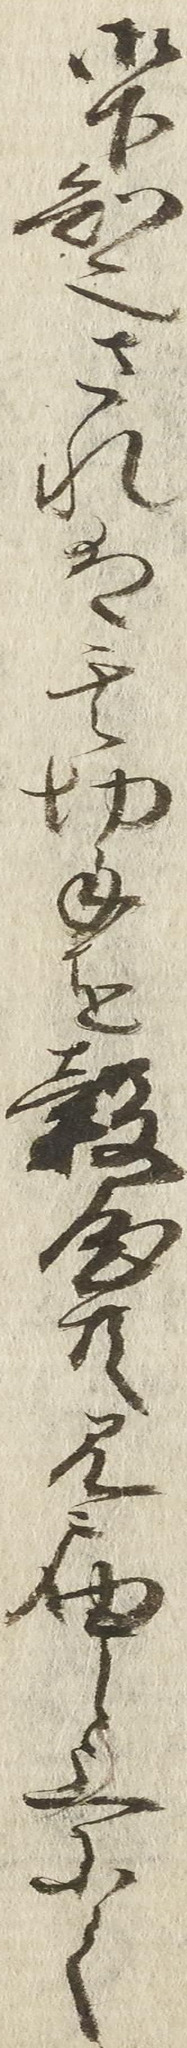御下知也されは其切手を穀屋共見届し上にて
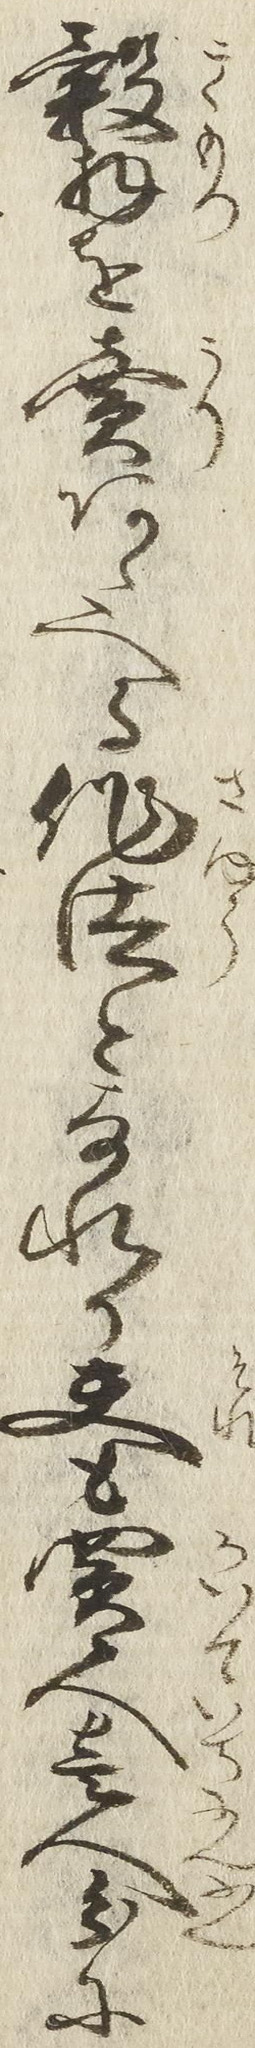穀物を売あたへる作法となれり夫も買人壱人分に
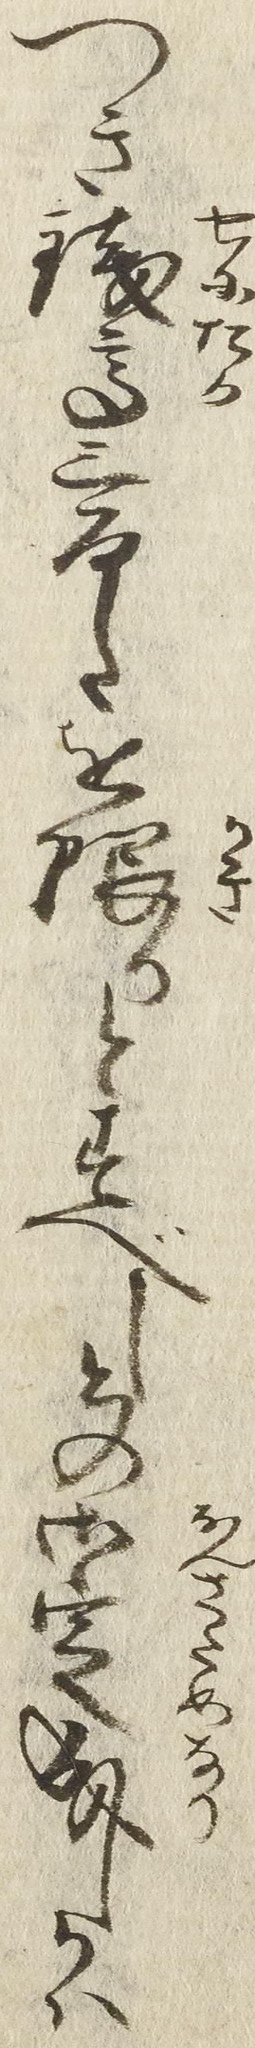つき銭高三百匁を限りとすべしとの御定成しかは
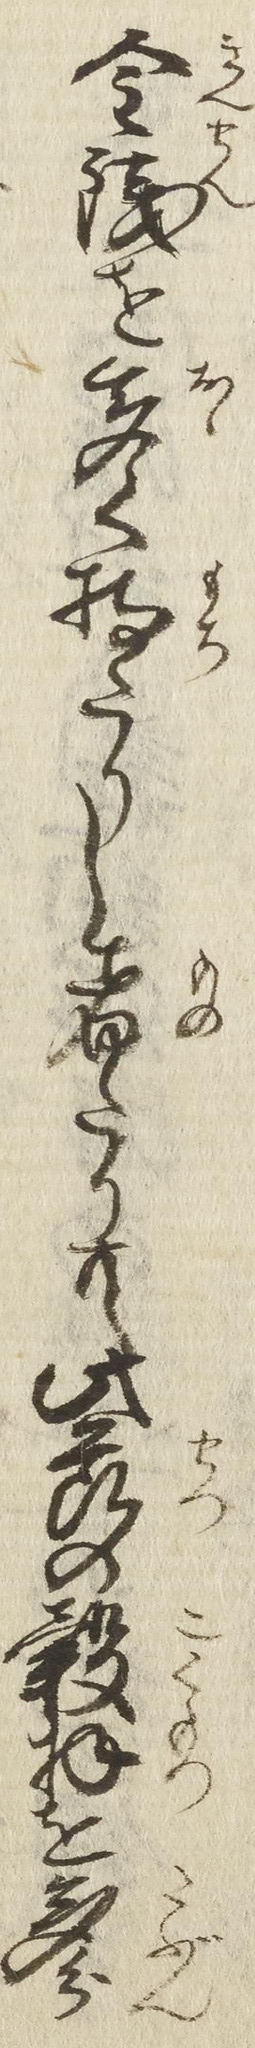金銭を多く持たりし者たり共此節の穀物を多分
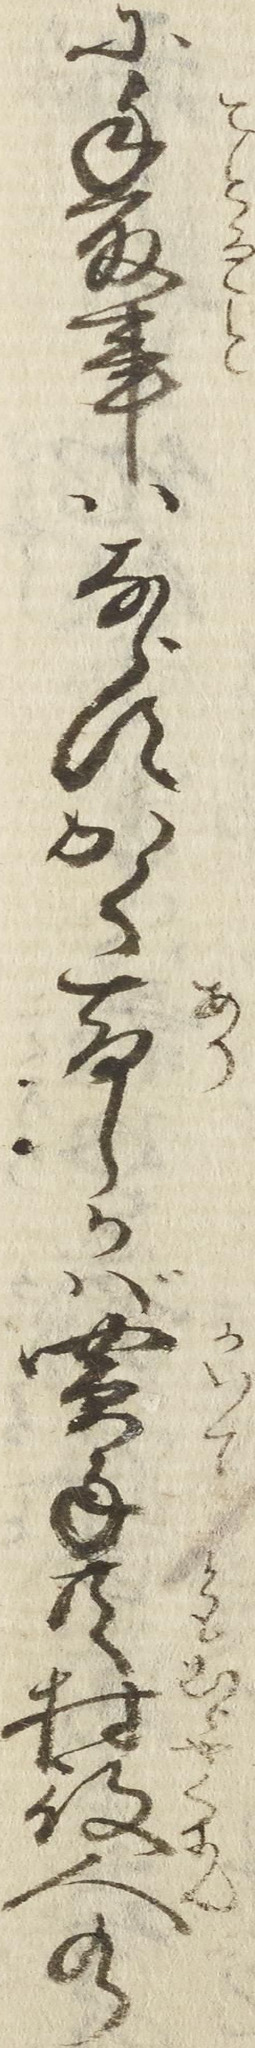に手取事はならすかく有しかば買手共村役人の
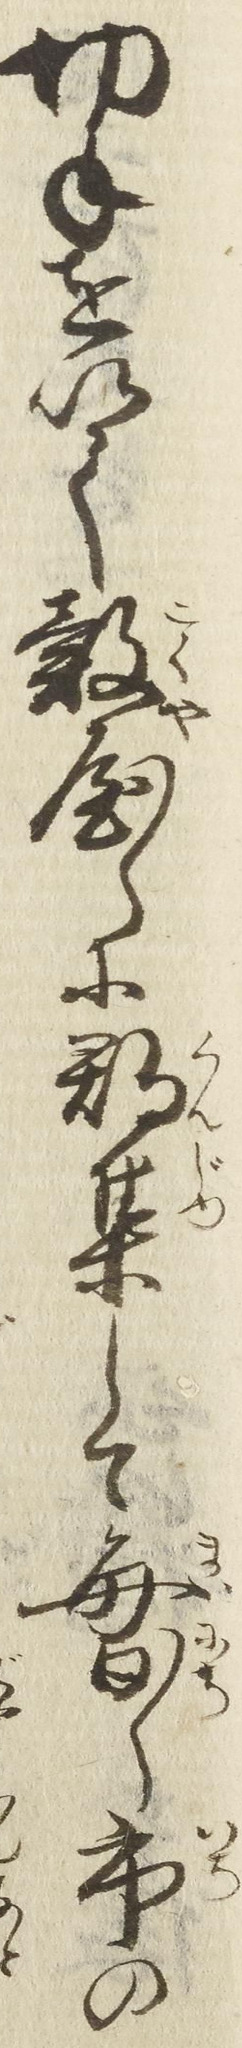切手を以て穀屋〳〵に群集して毎日〳〵市の
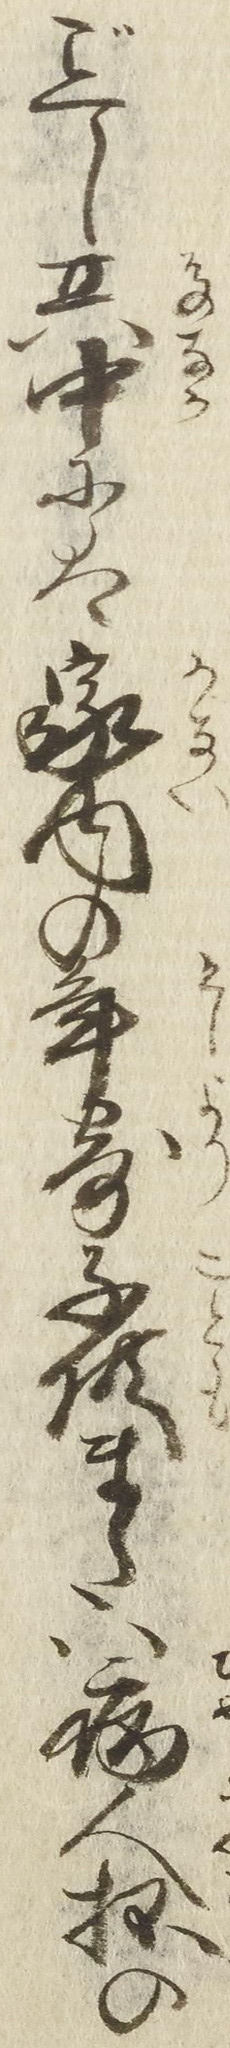ごとし其中には家内の年寄子供または病人抔の
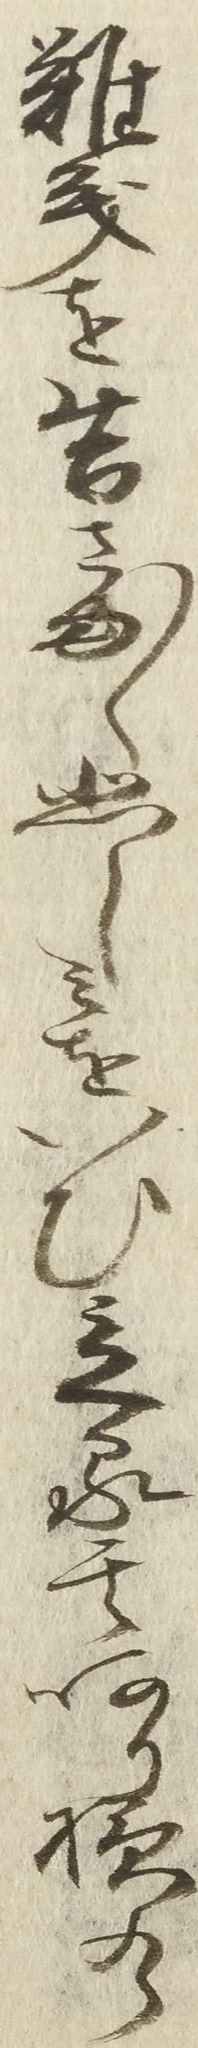難義を告さま〳〵悲しみをいひ立る其あり様の
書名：天明奇畧　全
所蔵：東京大学地震研究所図書室 Earthquake Research Institute Library, The University of Tokyo, JAPAN
